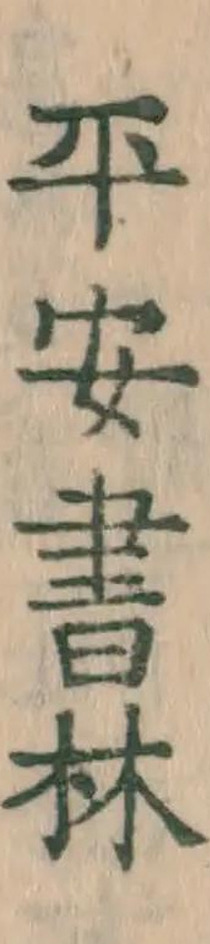平安書肆
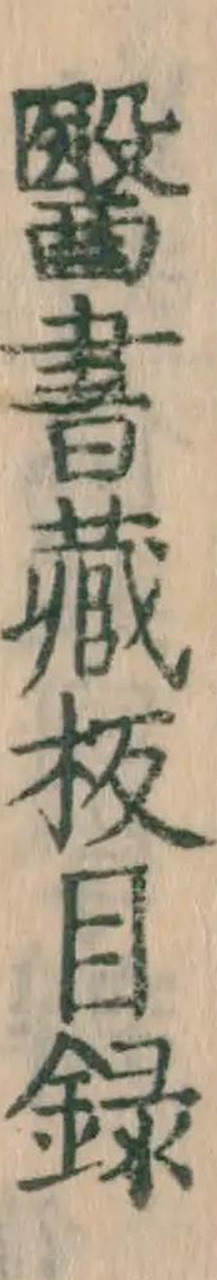医書蔵板目録
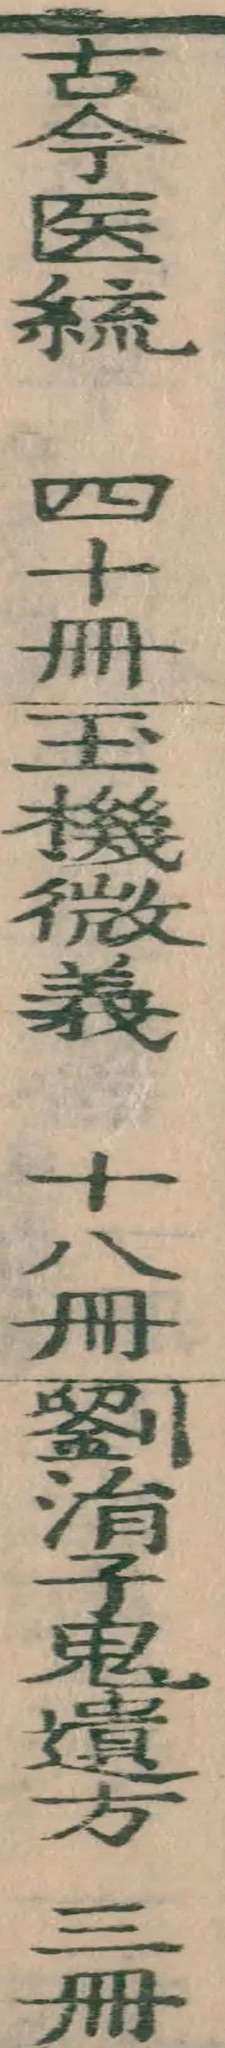古今医統四十冊玉機微義十八冊劉涓子鬼遺方三冊
